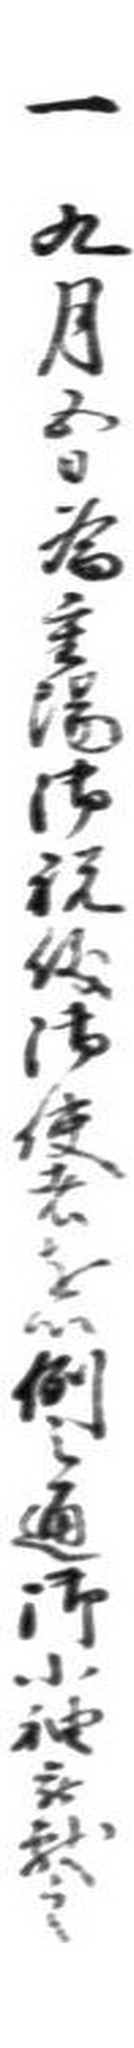一九月五日為重陽御祝儀御使者を以例之通御小袖被献之
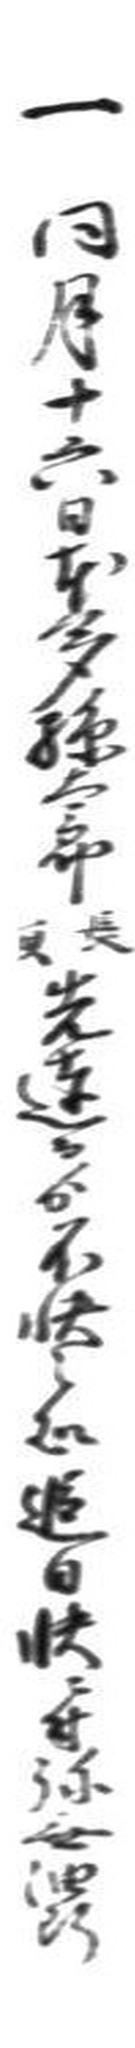一同月十六日本多孫太郎長員先達而ゟ不快之処追日快ニ付弥無油断
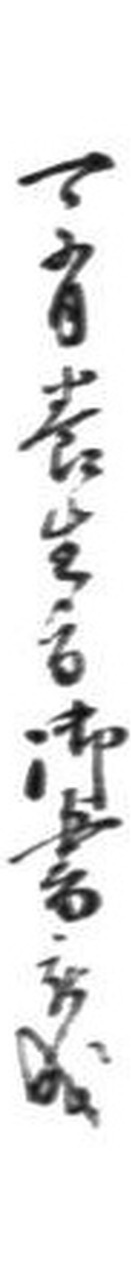可有養生旨御書被成

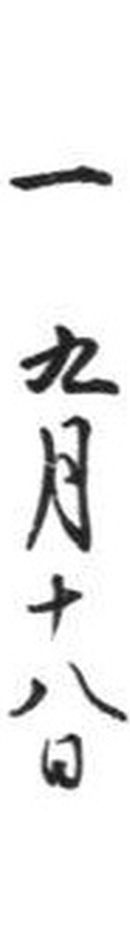一九月十八日
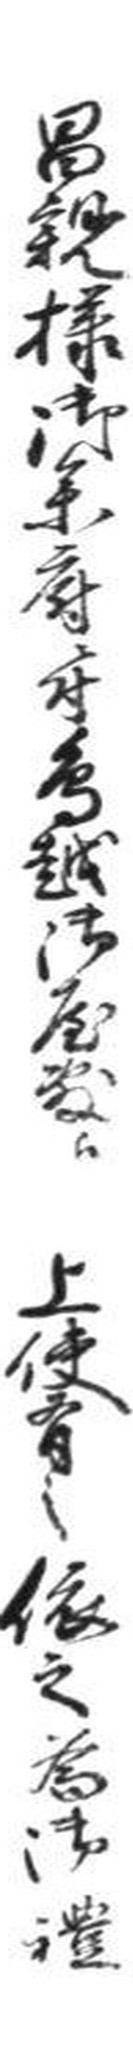昌親様御参府ニ付鳥越御屋敷江上使有之依之為御礼
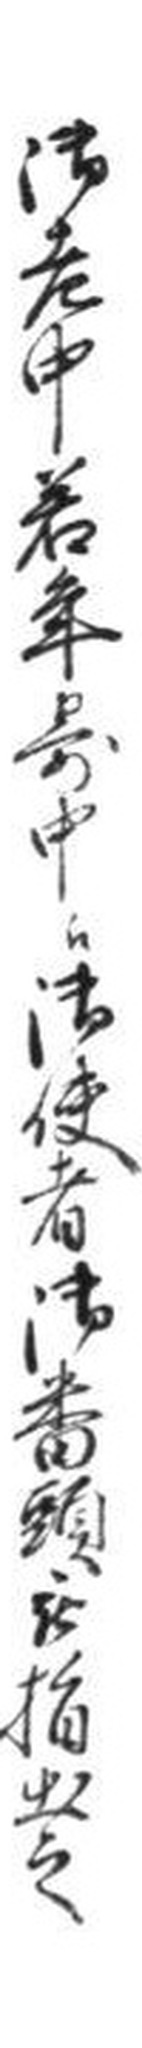御老中若年寄中江御使者御番頭被指出之
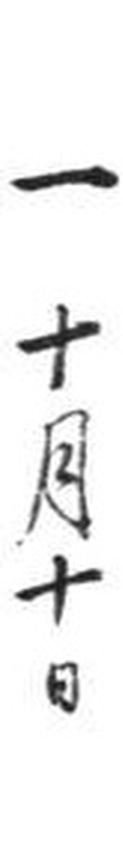一十月十日
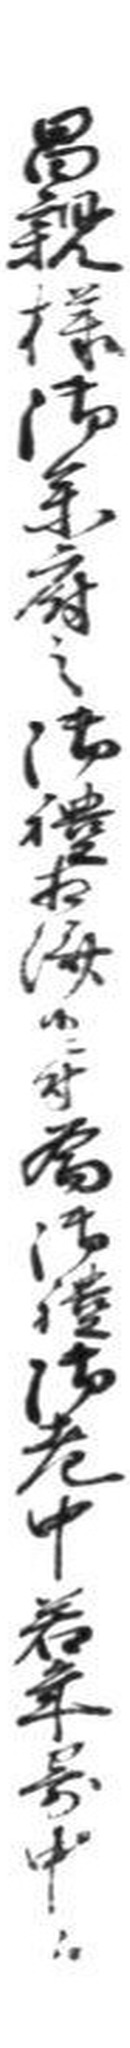昌親様御参府之御礼相済候ニ付為御礼御老中若年寄中江
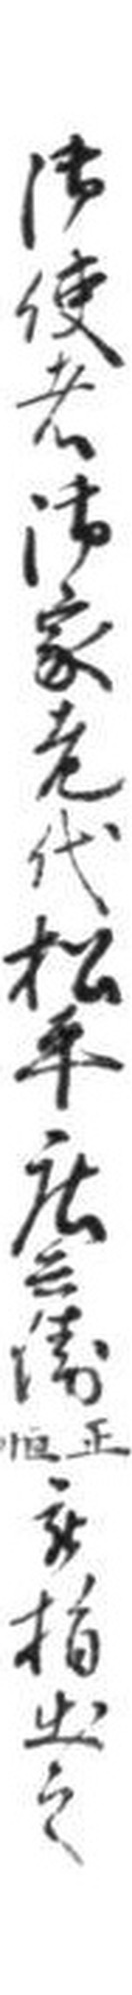御使者御家老代松平庄兵衛正恒被指出之
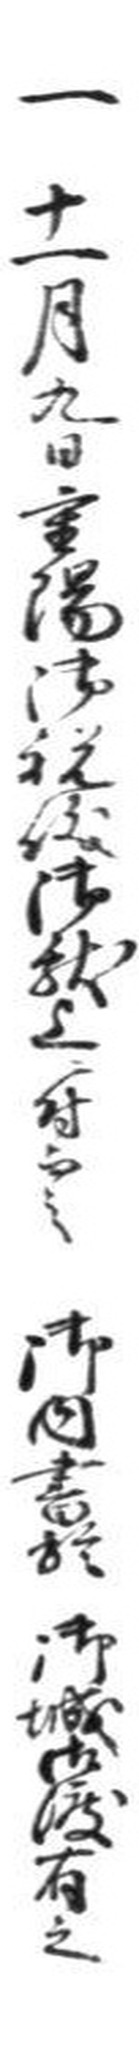一十一月九日重陽御祝儀御献上ニ付而之御内書於御城御渡有之
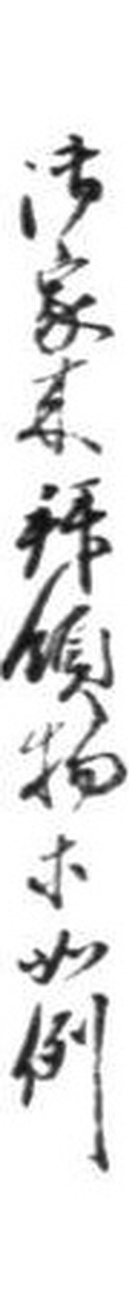御家来拝領物等如例
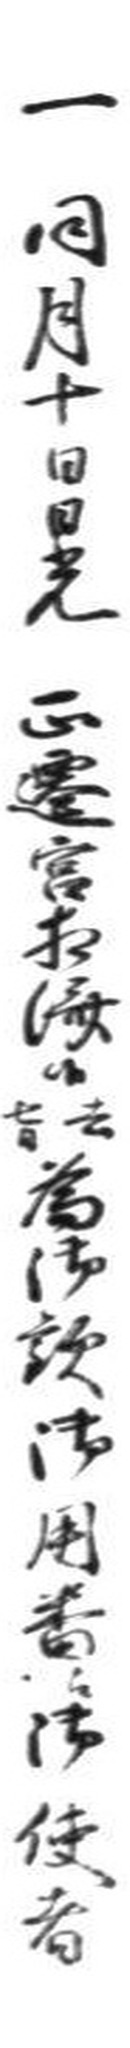一同月十日日光正遷宮相済候去七日為御歓御用番江御使者
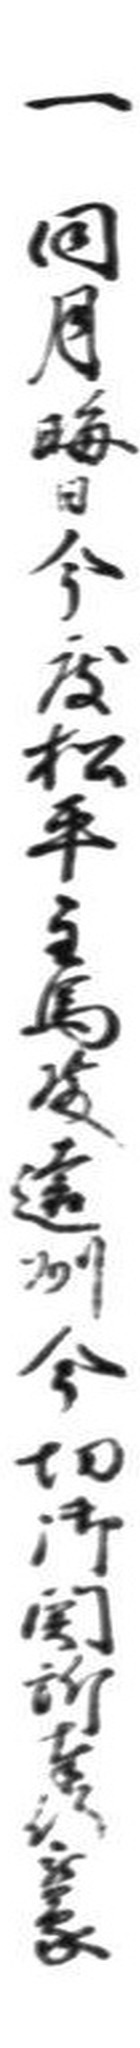一同月晦日今度松平主馬殿遠州今切御関所奉行被蒙
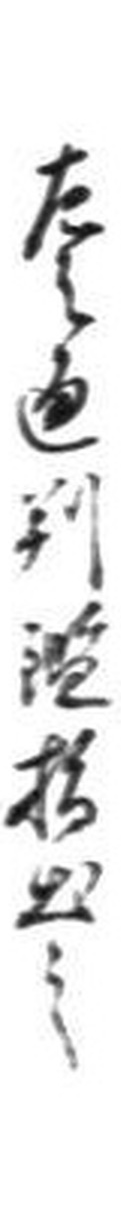左之通判鑑指出之
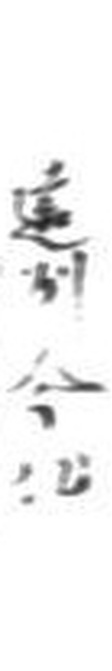遠州今切
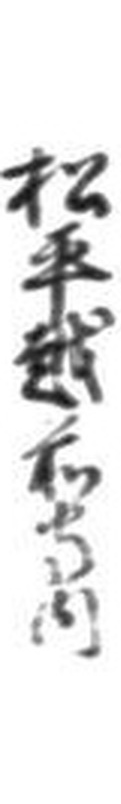松平越前守内
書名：家譜 十五 綱昌公 従天和元年到元禄十二年
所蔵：福井県文書館 Fukui Prefectural Archives
